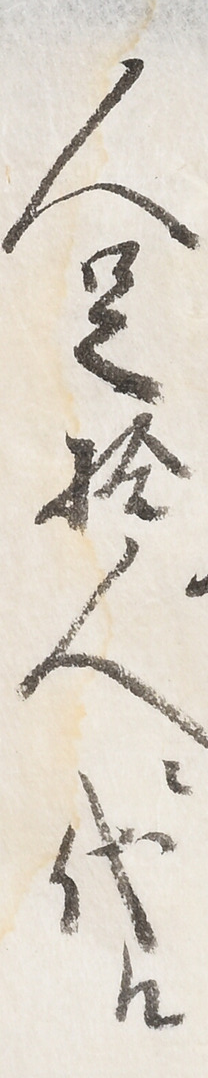人足十人ニ代ル
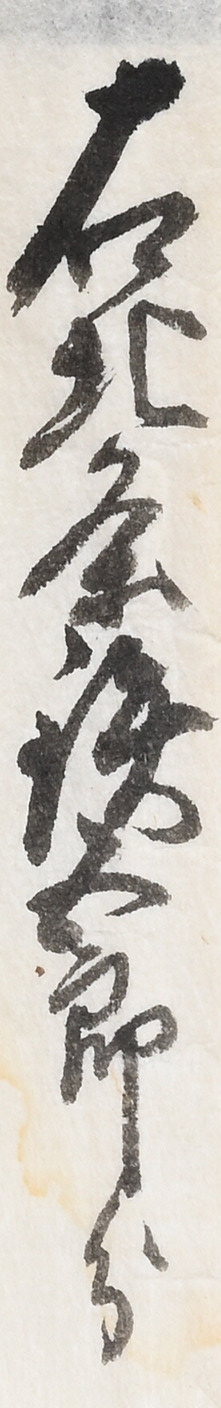右北条鉄五郎分
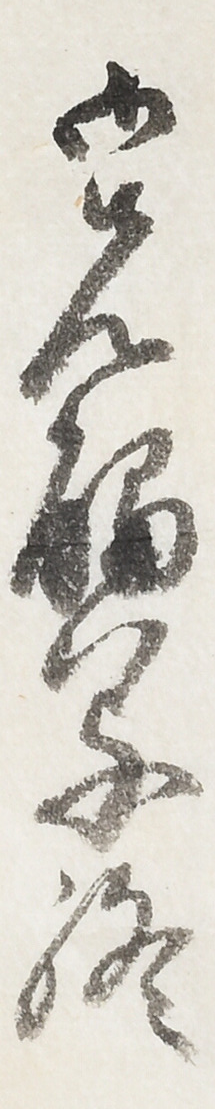御先触写終
